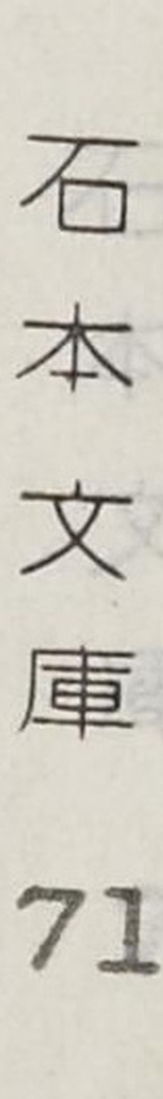石本文庫

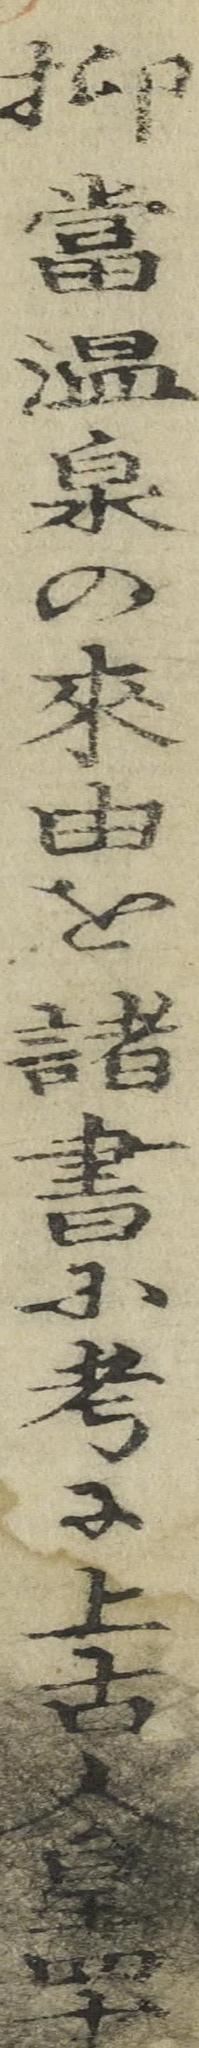抑當温泉の来由を諸書に考に上古人皇四十
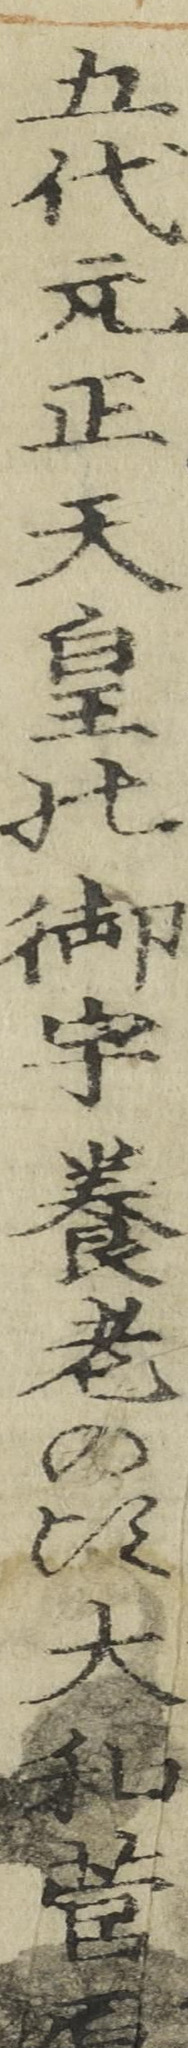五代元正天皇の御宇養老の頃大和菅原寺の
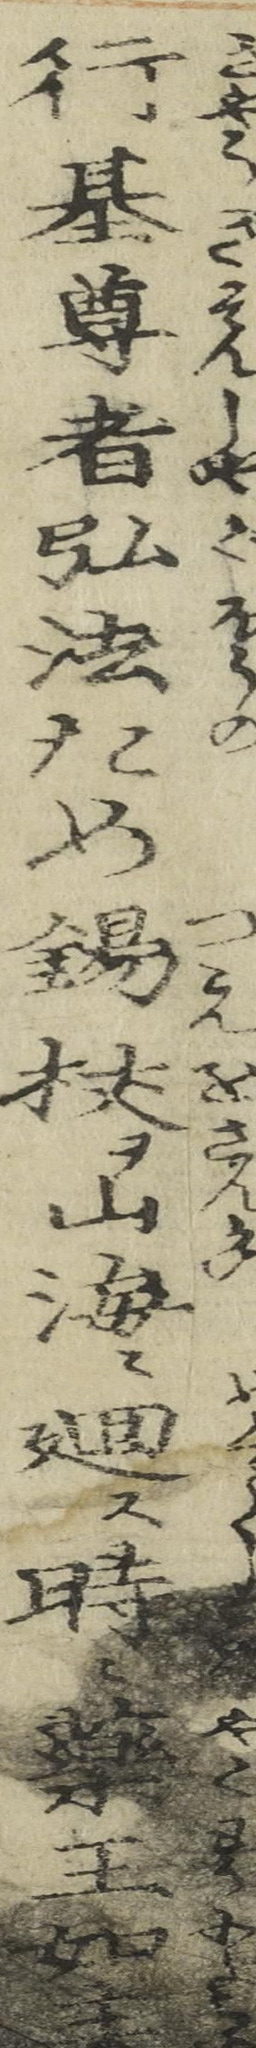行基尊者弘法ため錫杖ヲ山海ニ廻ス時ニ薬王如来
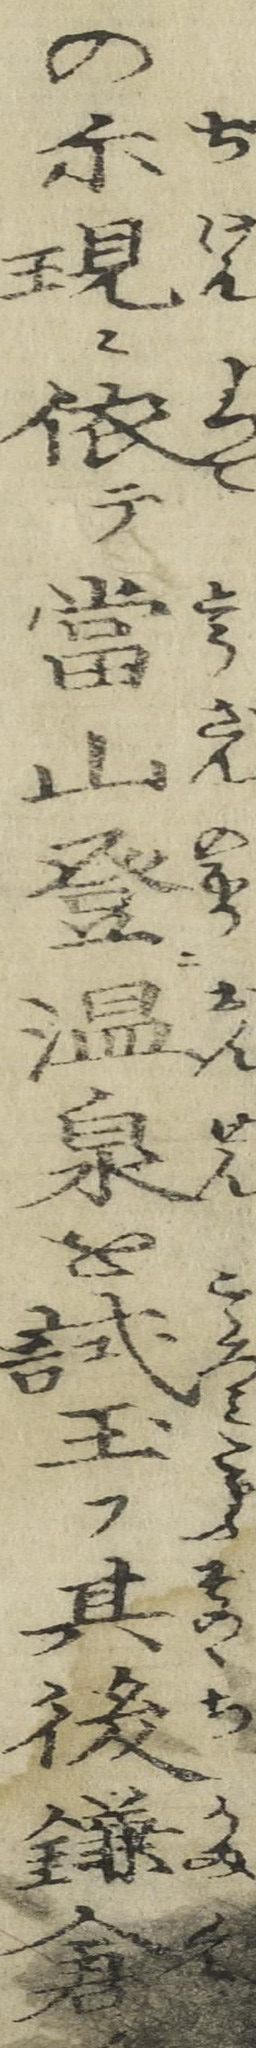の示現ニ依テ當山登ニ温泉を試玉フ其後鎌倉ノ
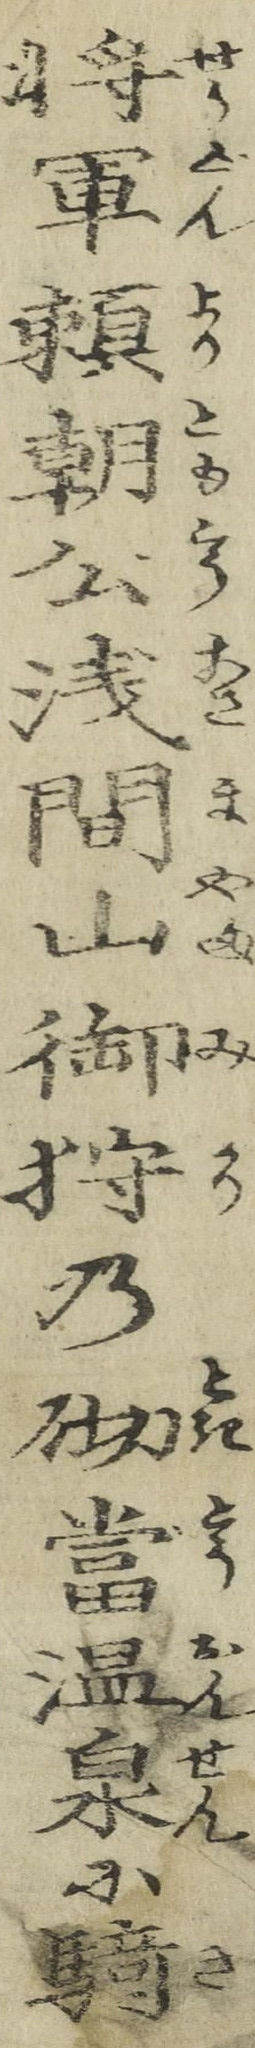将軍頼朝公浅間山御狩乃砌當温泉に騎
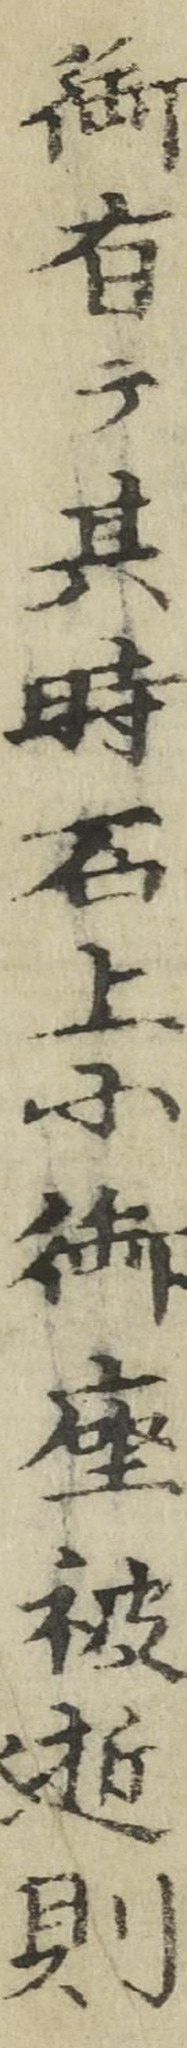御有テ其時石上に御坐被遊即則
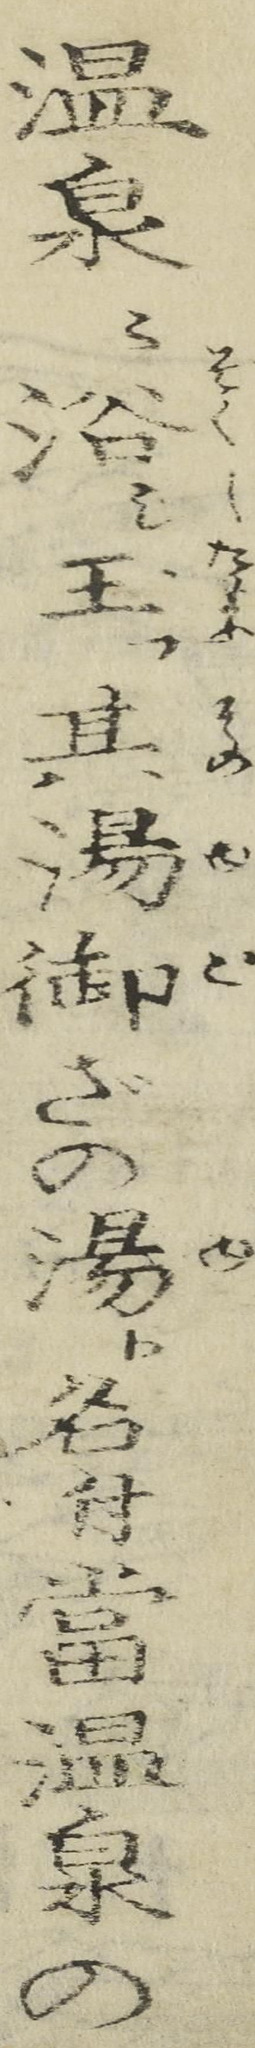温泉ニ浴し玉フ其湯御ざの湯ト名付當温泉の
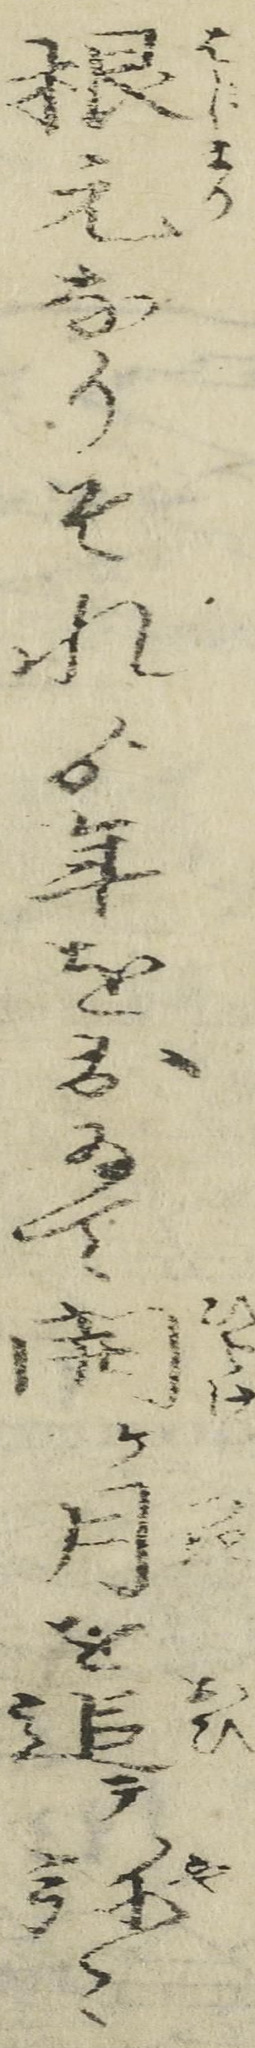根元なりそれゟ年をおゐて開ケ月を追テ弥々
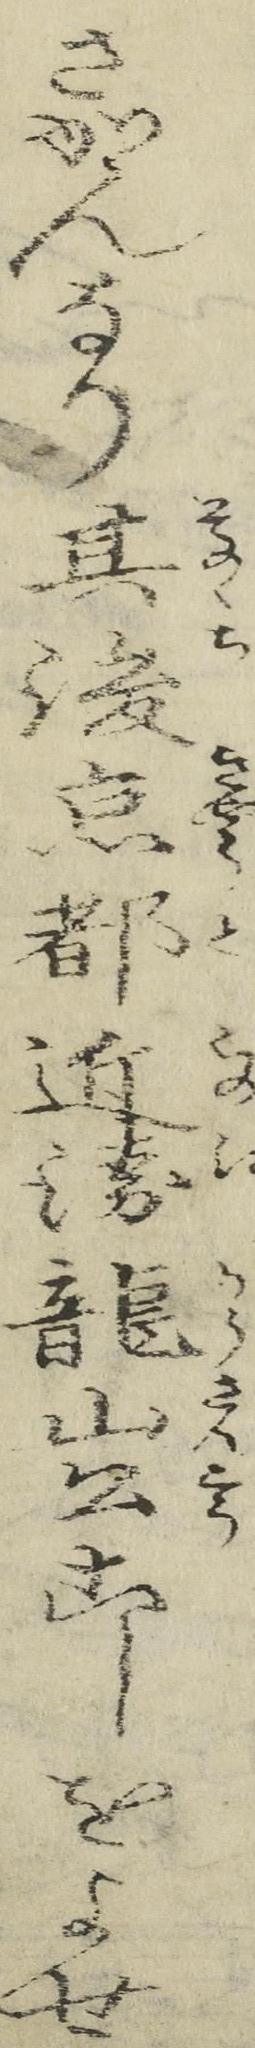さかんなり其後京都近衛龍山公こしをよせ
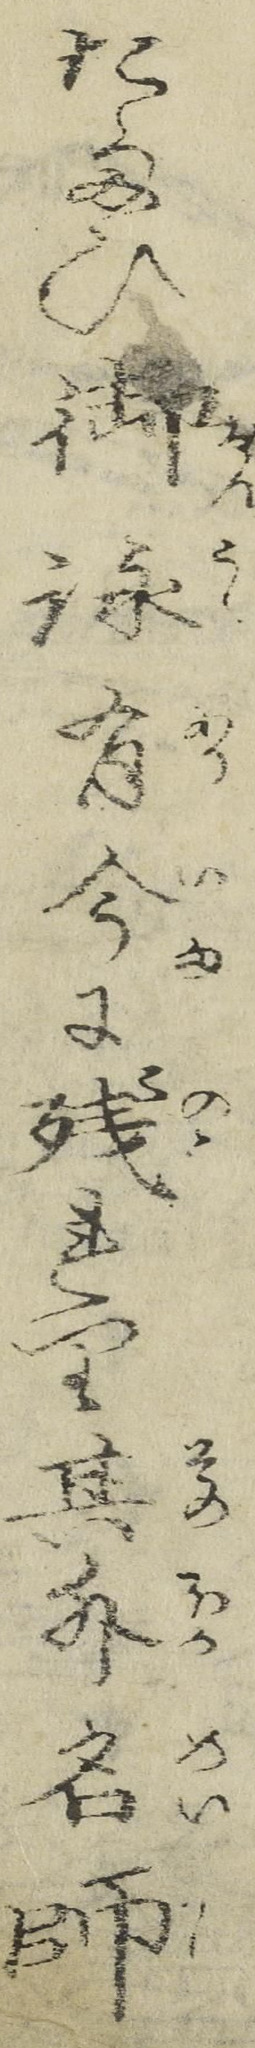たまひ御詠有今に残れり其外名師
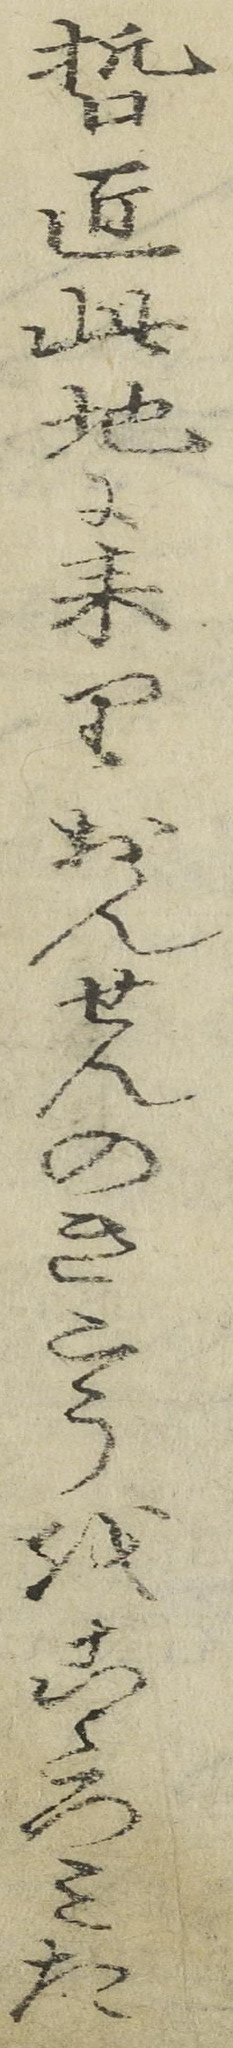哲道此地に来りおんせんのきこうをこゝろみた
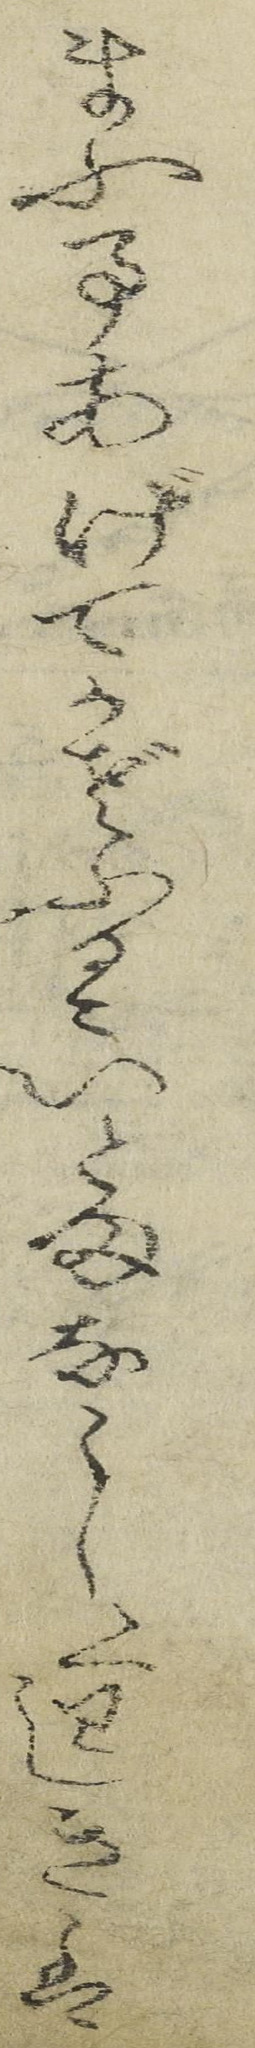まふ事あげてかぞふるニいとまなしくわしきは
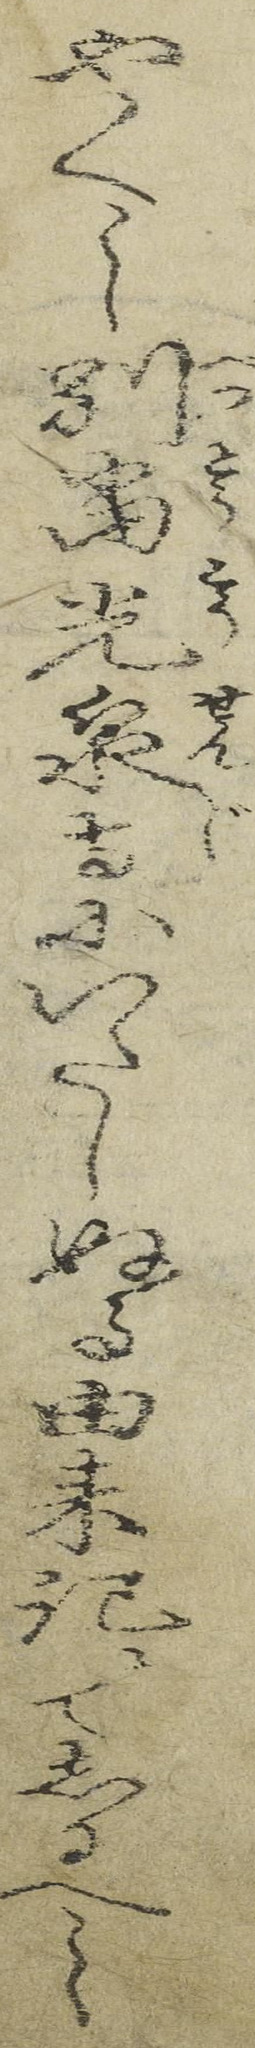やくし別當光泉寺にいたしぬる由来来記ニてしるへし

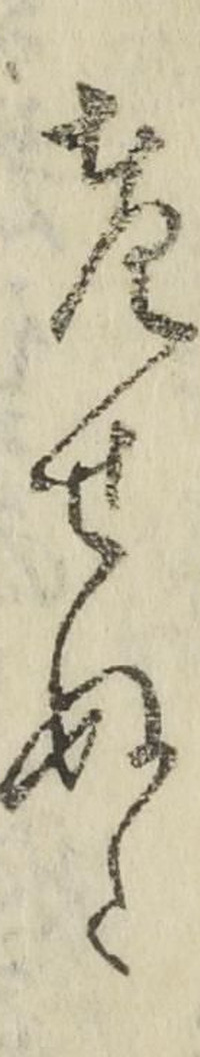老せぬと

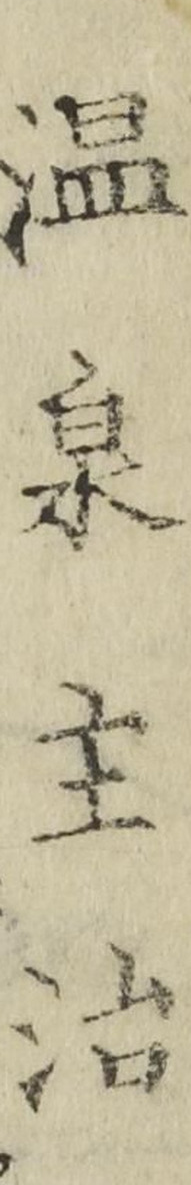温泉主治
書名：草津温泉　入湯案内記
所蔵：東京大学地震研究所図書室 Earthquake Research Institute Library, The University of Tokyo, JAPAN
